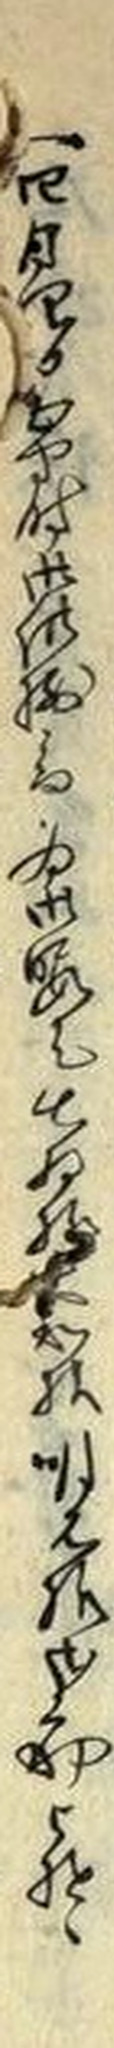一四月四日五半時御供揃ニ而為御暇乞出羽様大和様明石様御勤被遊候
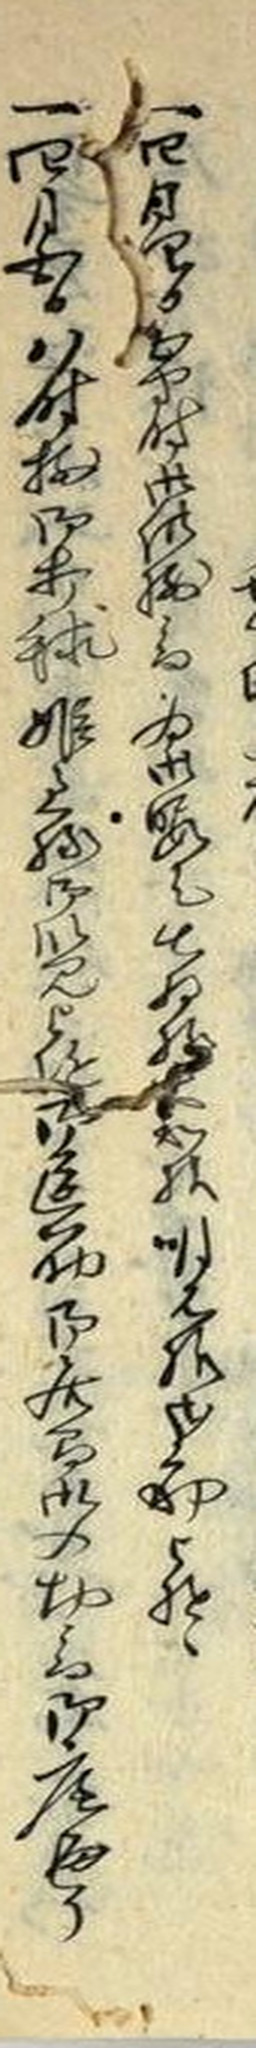一四月五日八時揃御打毬姫君様御覧被遊御道筋御居間御〆切ニ而御庭通り

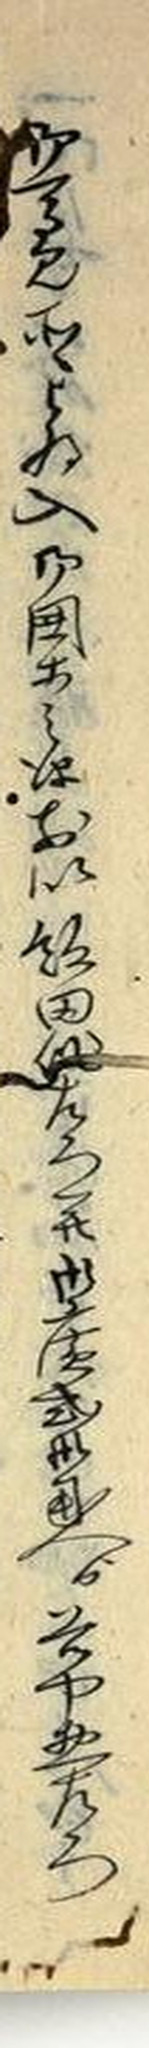御馬見所へ被為入御囲等之儀前以飯田作左衛門并御広式御用人ゟ谷中惣左衛門
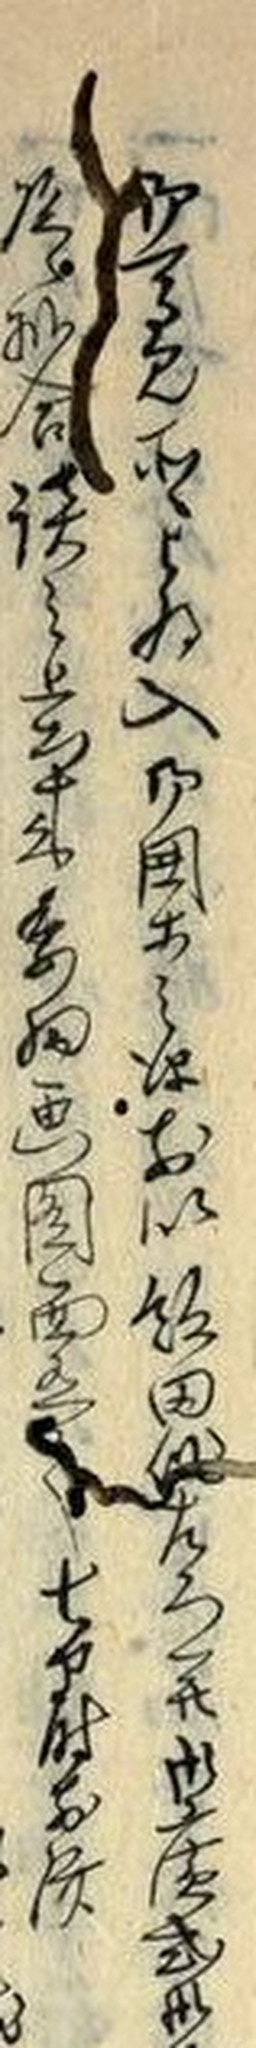殿へ掛合談之上出来委細画図面有之七半時前済
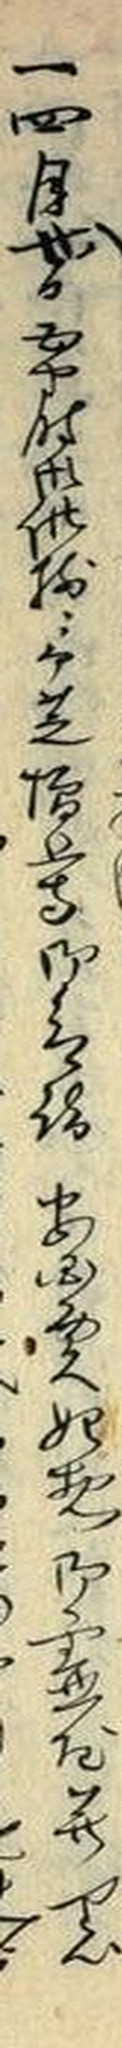一四月八日五半時御供揃ニ而芝増上寺御参詣安国殿始惣御霊屋并黒
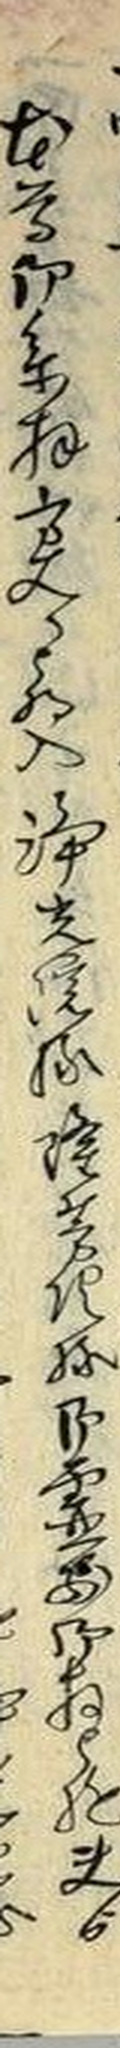本尊御参拝方丈へ被為入淨光院様隆芳院様御霊前御拝被遊夫ゟ
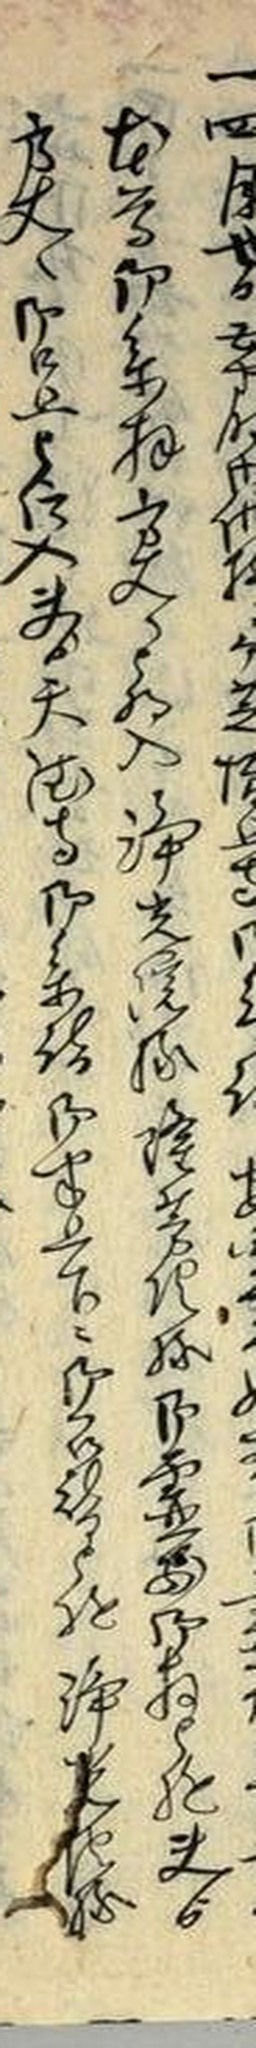方丈へ御口上被仰入夫ゟ天徳寺御参詣御半上下ニ御召替被遊浄光院様
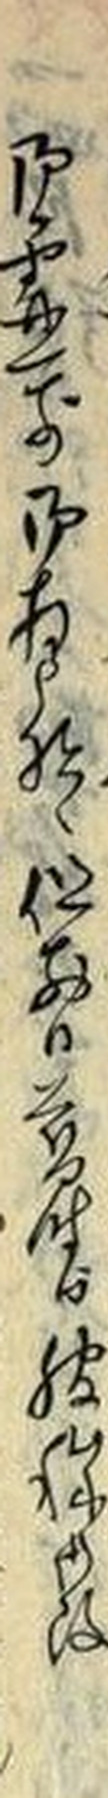御霊前御拝被遊候但前日暮時ゟ服穢御改
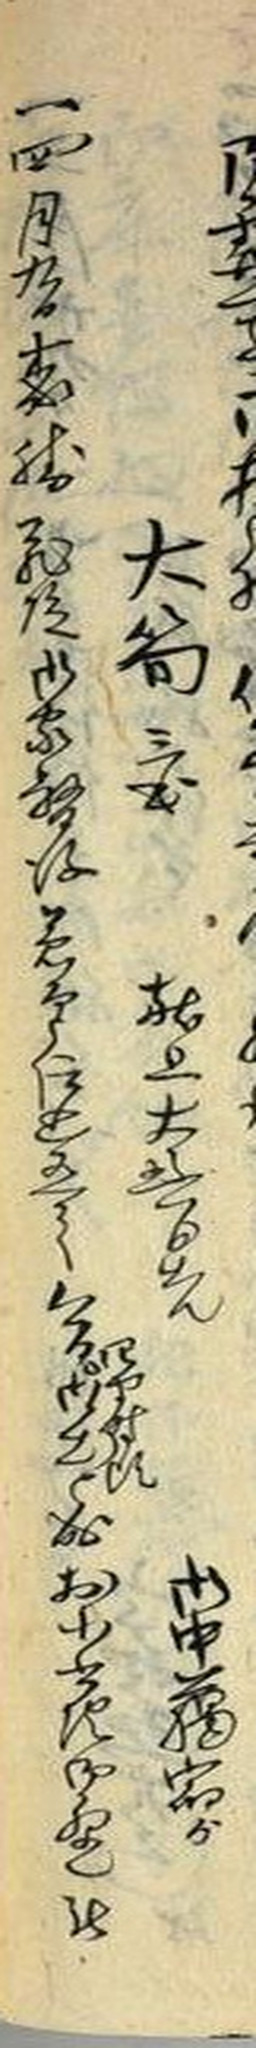一四月九日森勝蔵殿御家督後兼而被仰遣有之今日四半時頃御出被成於小書院御逢被
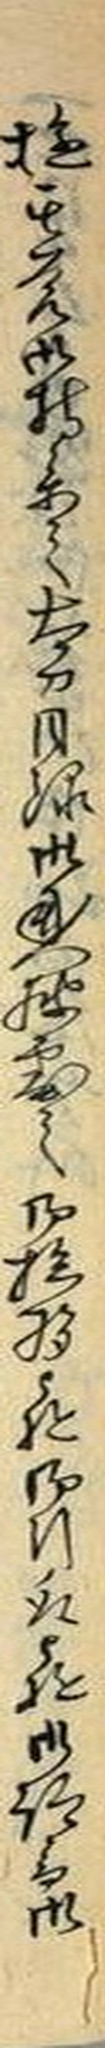遊其節御持参之太刀目録御用人披露之御挨拶被遊御引取被遊御跡ニ而御
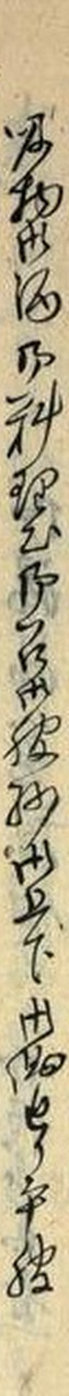吸物御酒御料理出御召御服紗御上下御側廻り平服
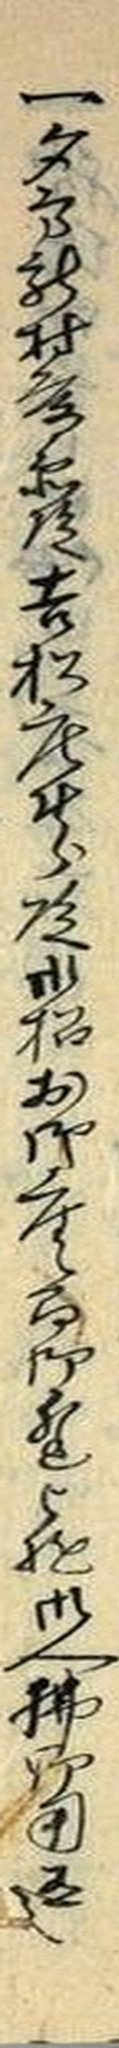一夕方新村藤兵衛殿吉松庄次郎殿御招於御座之間御逢被遊御人払御用有之
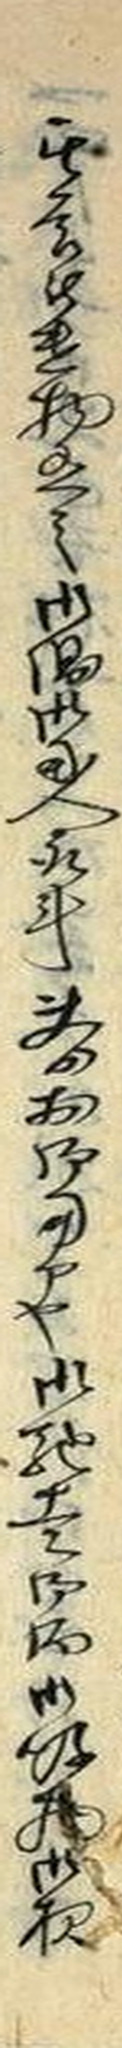其節被遣物有之御側御用人取斗夫ゟ於御用部や御馳走御酒御吸物御夜
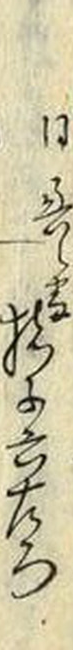同奥之番猪子六左衛門

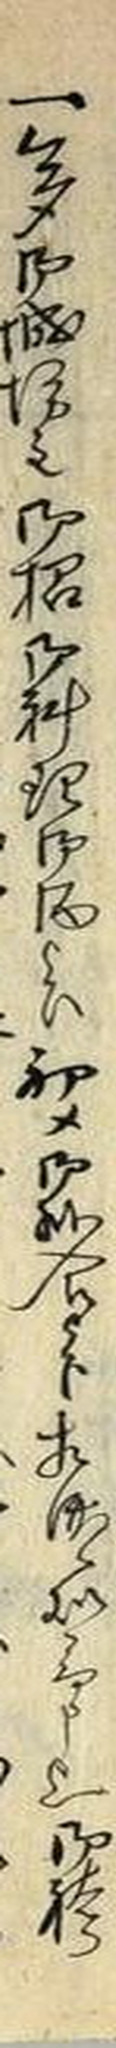一今夕御城坊主御招御料理御酒被下候初メ御掛合被下相済候処ニ而申上御袴
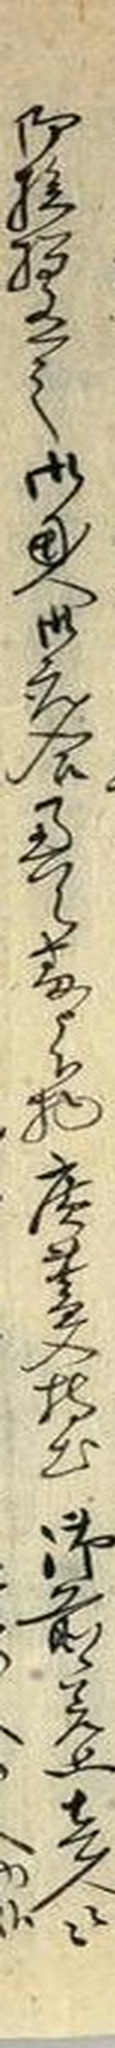御挨拶有之御用人御取合奥之番被下物広蓋入持出御前へ差上壱人〃〃
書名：少傅日録抄（斉承付側向頭取日記、在府）
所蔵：福井県文書館 Fukui Prefectural Archives
